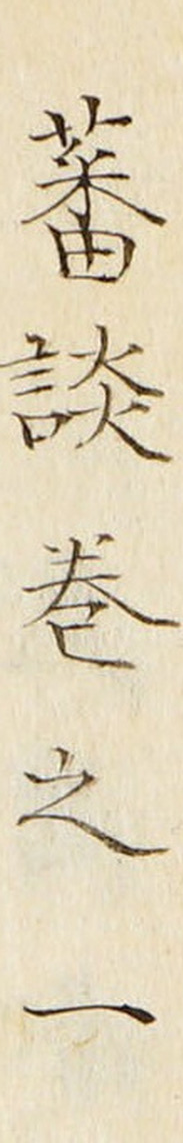蕃談巻之一

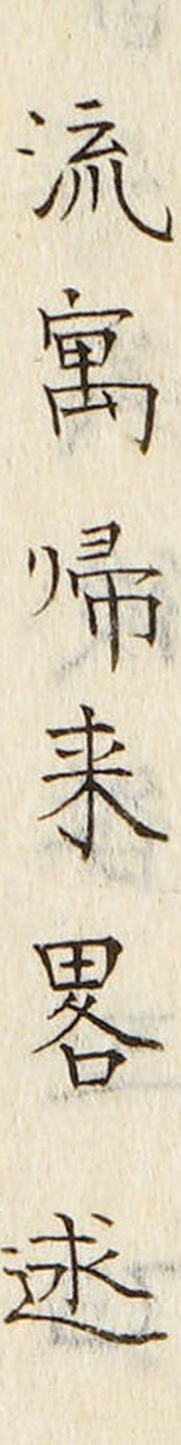流寓帰来略述
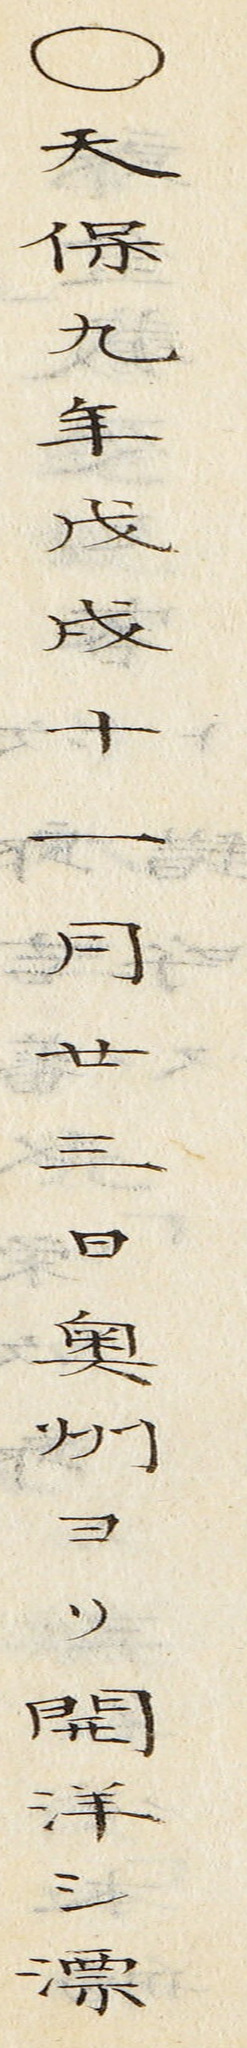○天保九年戊戌十一月廿三日奥州ヨリ開洋シ漂
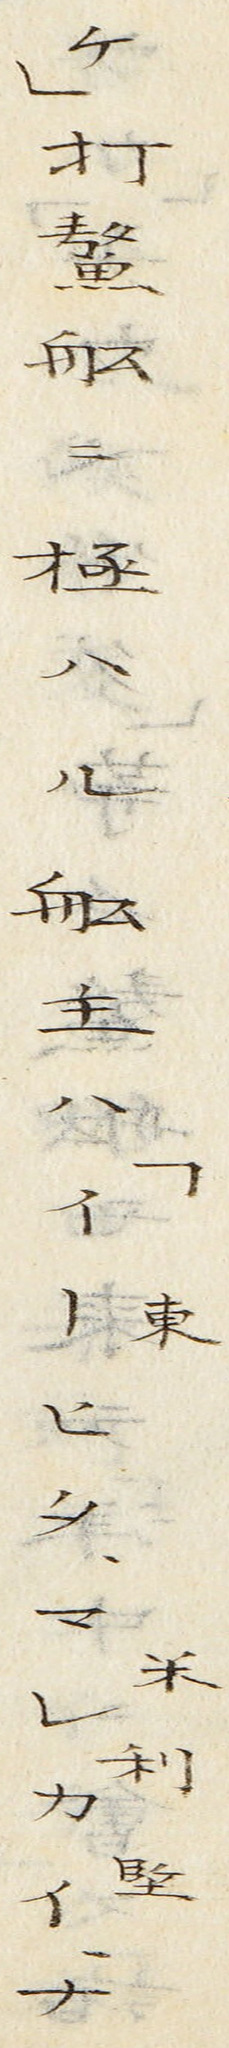ケ」打鰲舩ニ極ハル舩主ハ「イーヒタ、マレカイ、ナ

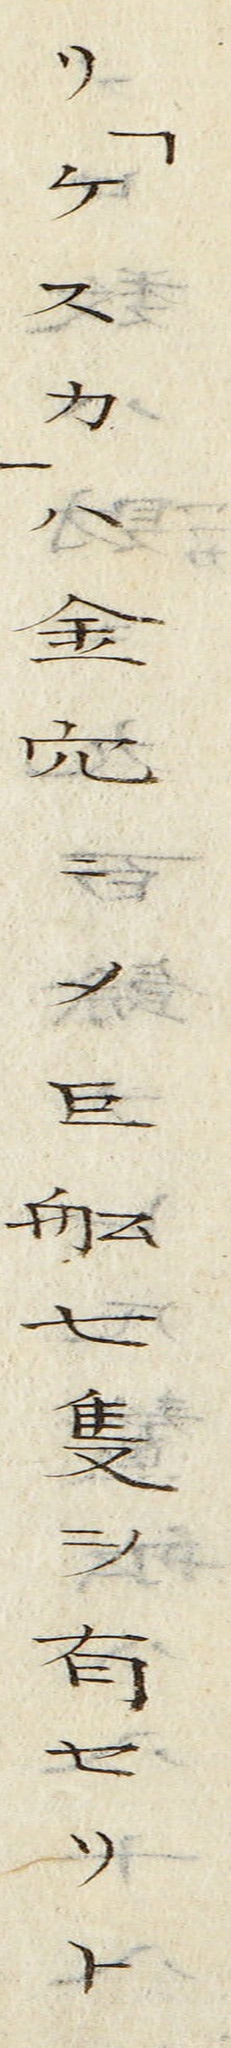リ「ケスカ」ハ金穴ニシテ巨舩七隻ヲ有セリト
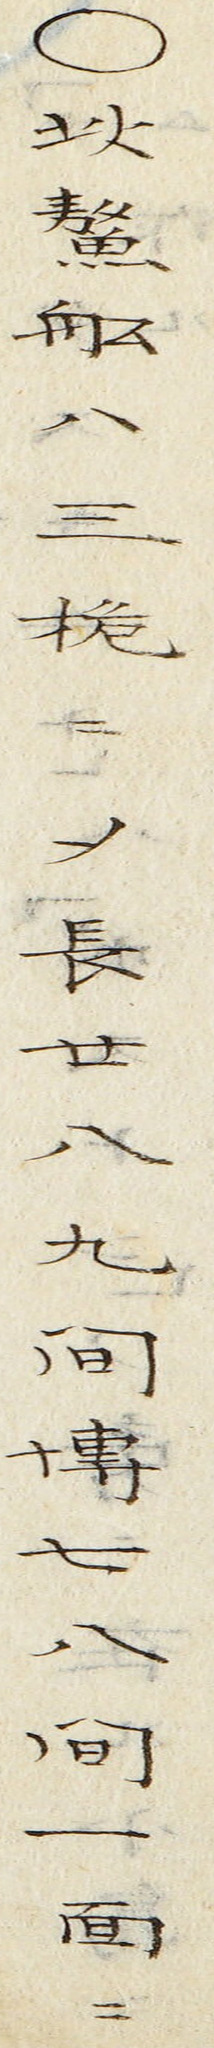○此鰲舩ハ三桅ニシテ長廿八九間博七八間一面ニ
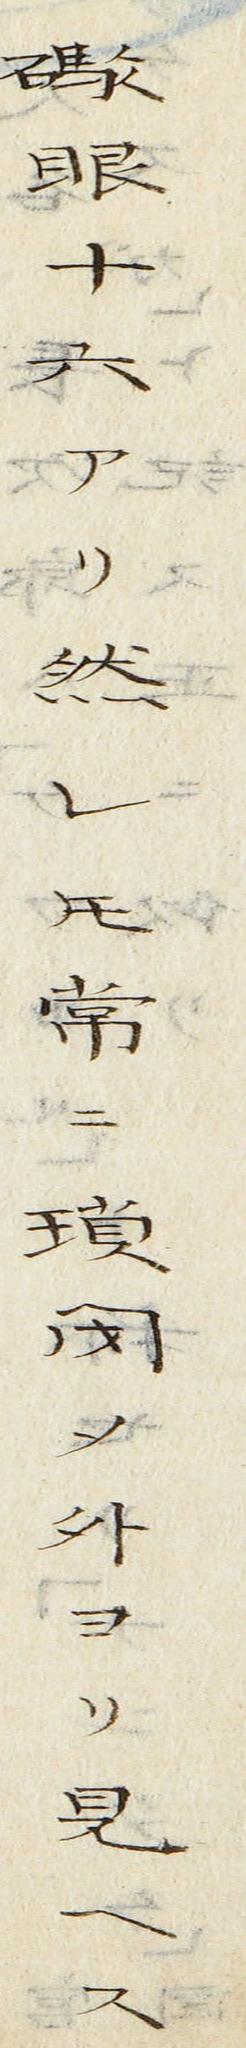礟眼十六アリ然レトモ常ニ瑣閉シテ外ヨリ見ヘス
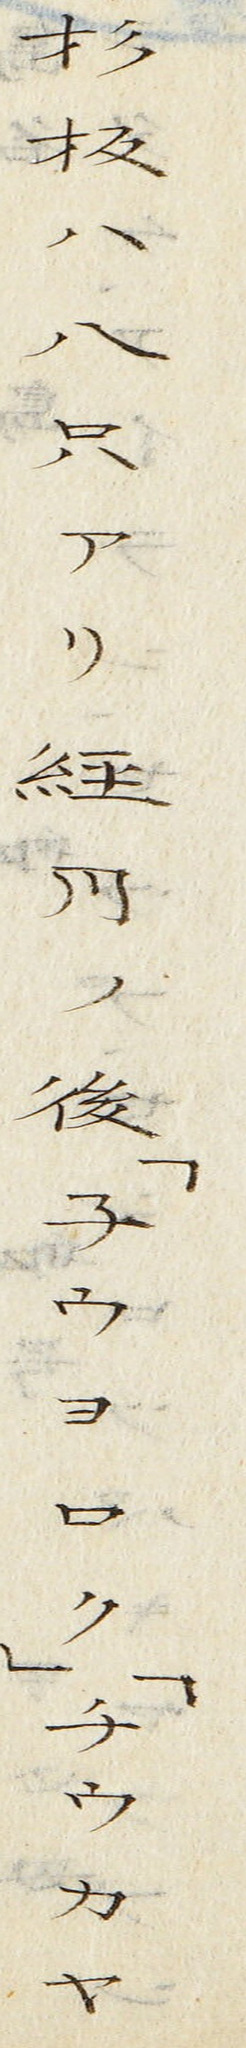杉板ハ八只アリ経月ノ後「ネウヨロク」「チウカヤ
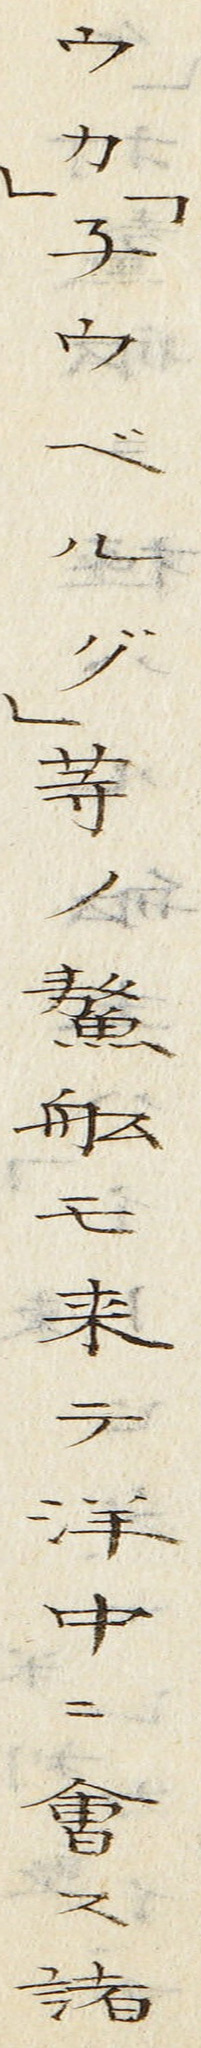ウカ」「ネウベルグ」等ノ鰲舩モ来テ洋中ニ会ス諸
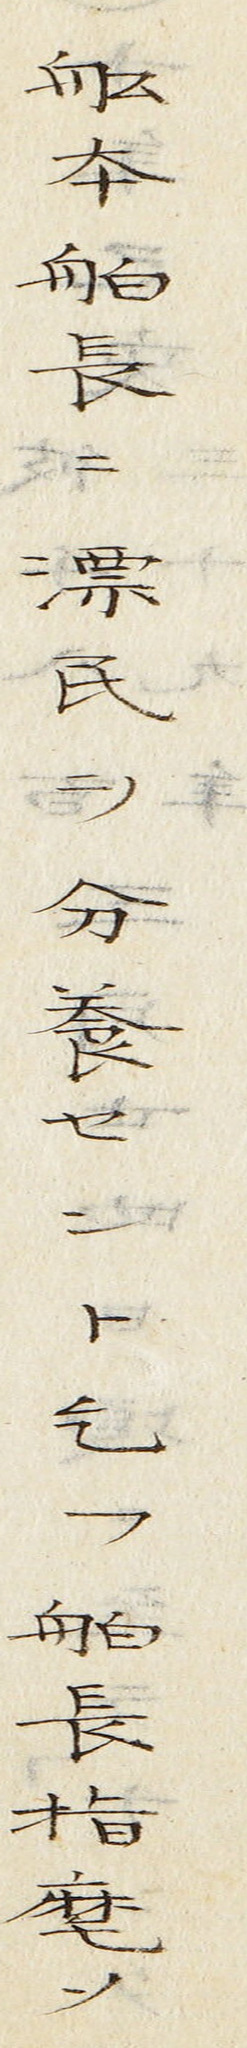舩本舶長ニ漂民ヲ分養セント乞フ舶長指麾ヲ
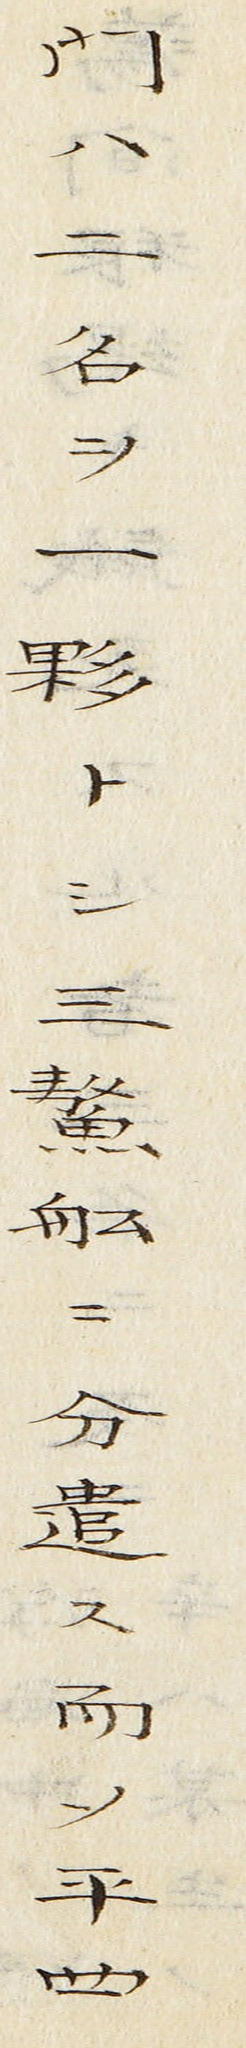門ハ二名ヲ一夥トシ三鰲舩ニ分遣ス而シテ平四
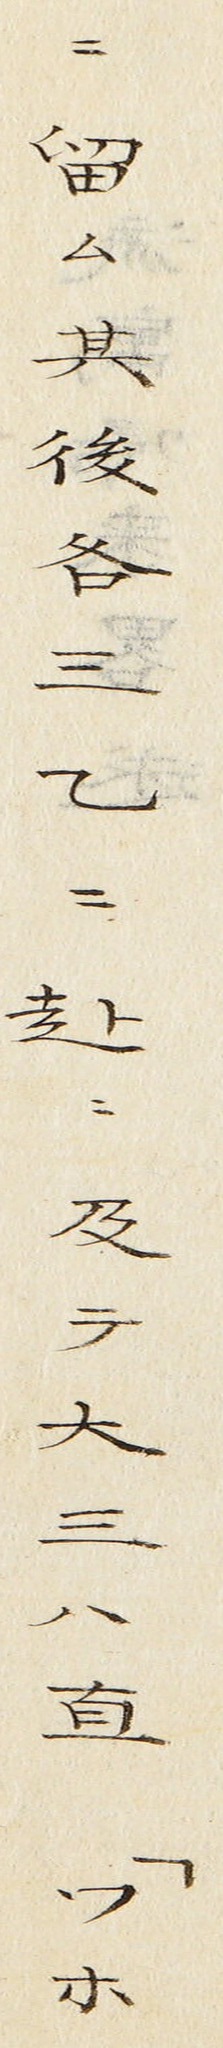ニ留ム其後各三乙ニ赴ニ大三ハ直「ワホ
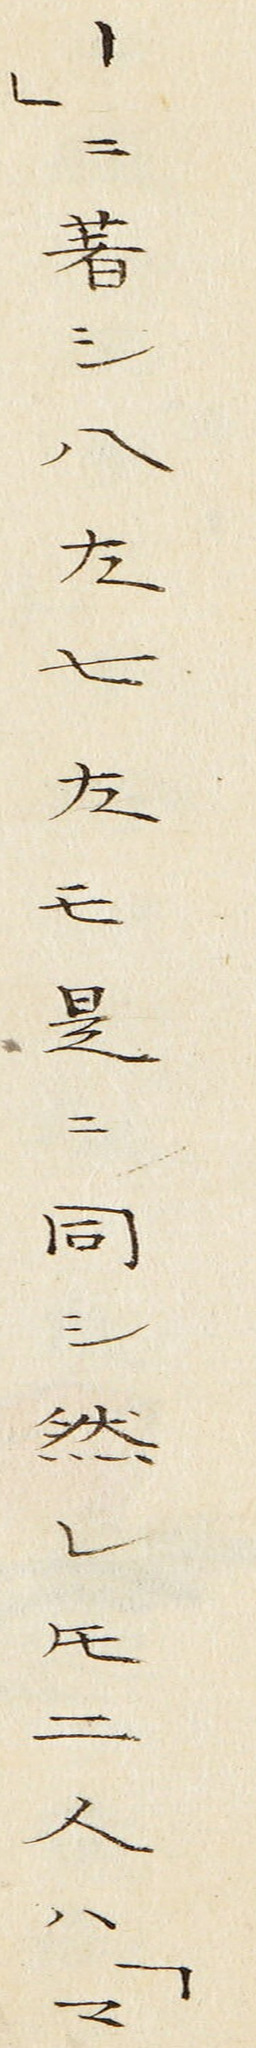ー」ニ著シ八左七左モ是ニ同シ然レトモ二人ハ「マ
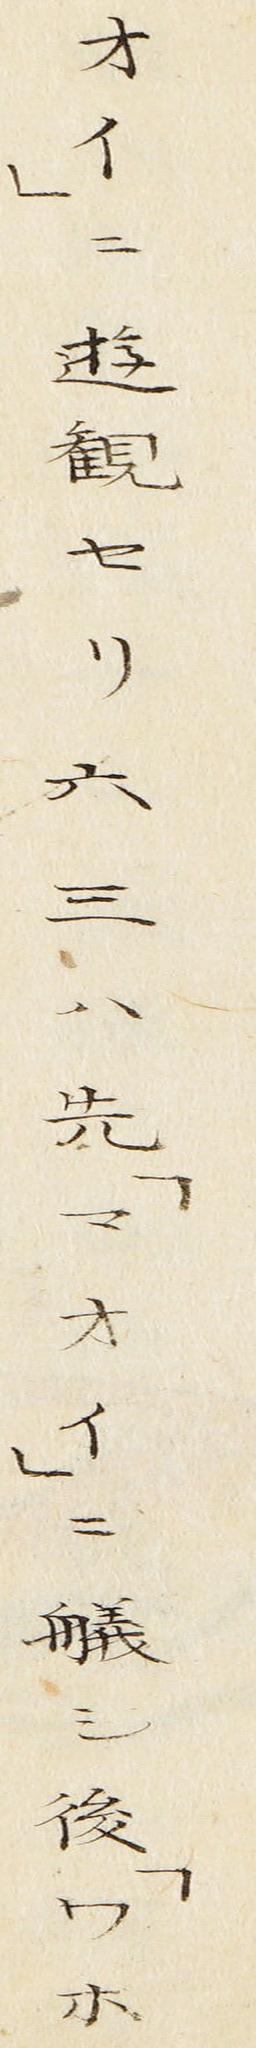オイ」ニ遊観セリ六三ハ先「マオイ」ニ艤シ後「ワホ
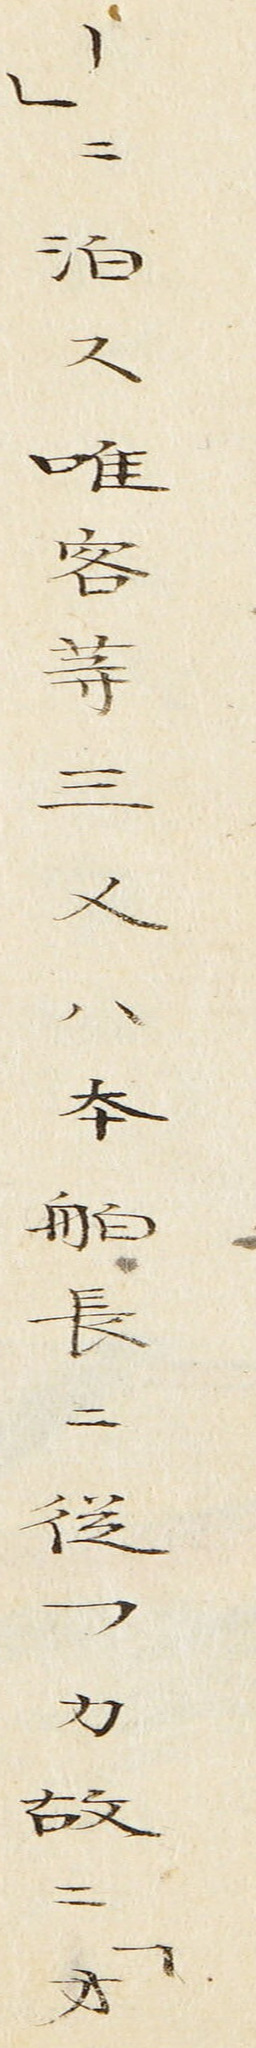ー」ニ泊ス唯客等三人ハ本舶長ニ従フカ故ニ「オ
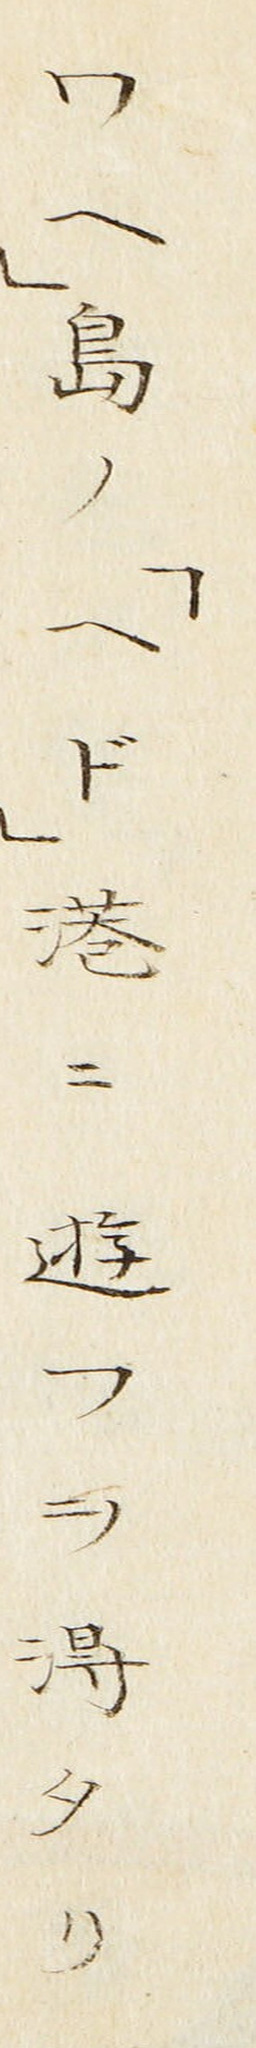ワヘ」島ノ「ヘド」港ニ遊フヲ得タリ
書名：蕃談
